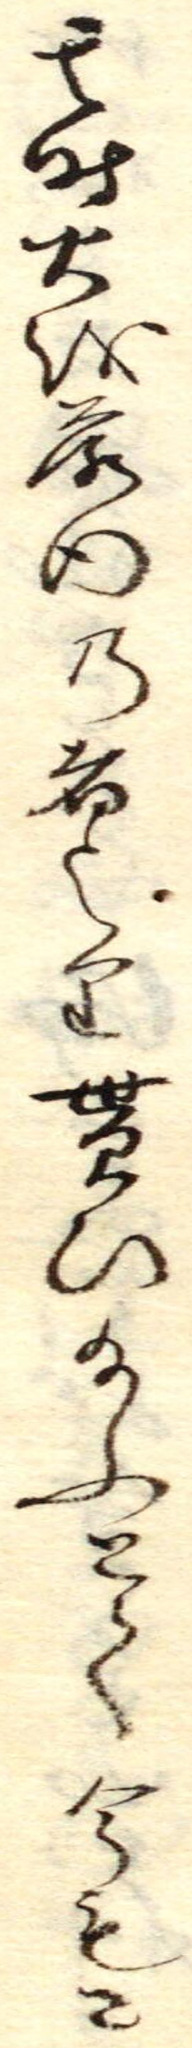其時火を落内の者より貰ひ給ふとて今もさ
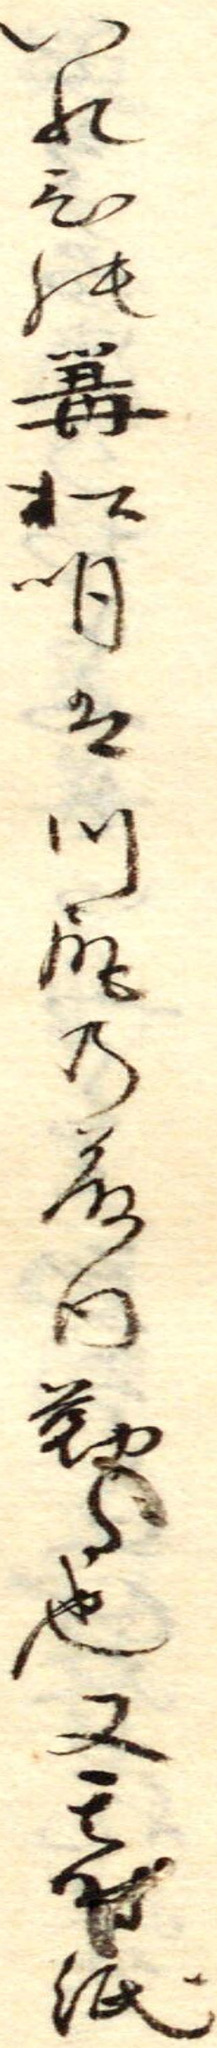いれひの篝松明は川尻の藤内勤る也又其時紙

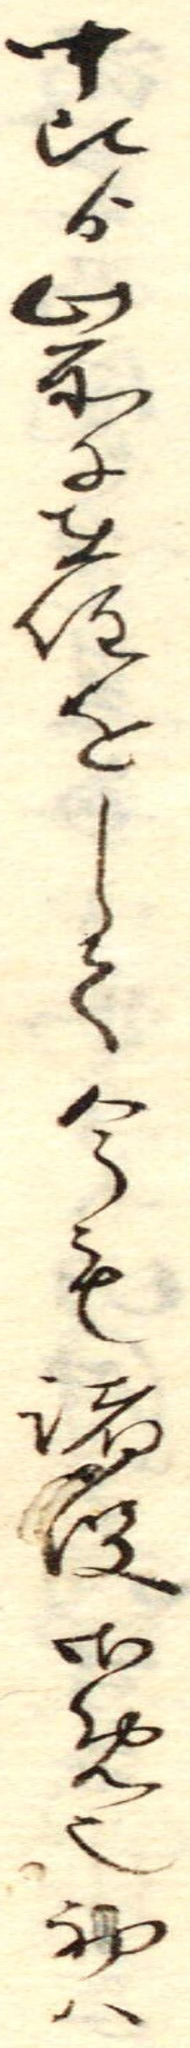中比ゟ此所に在住をして今も諸役御免也初は
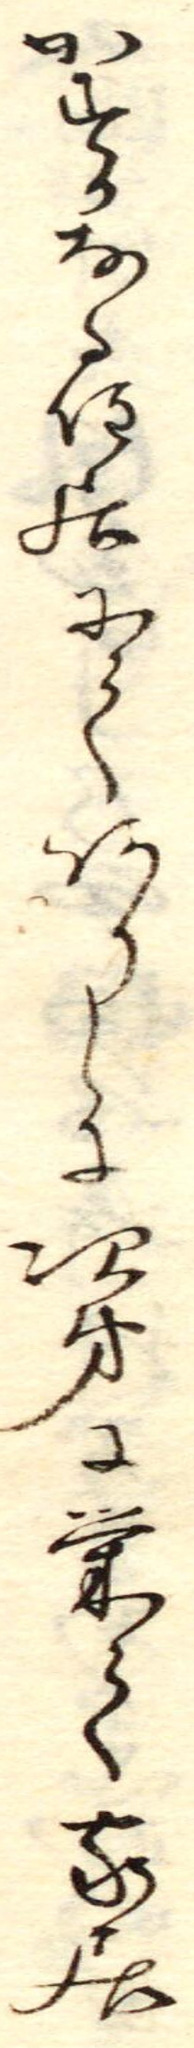かすかなる住居にてありしに次第に栄て家居
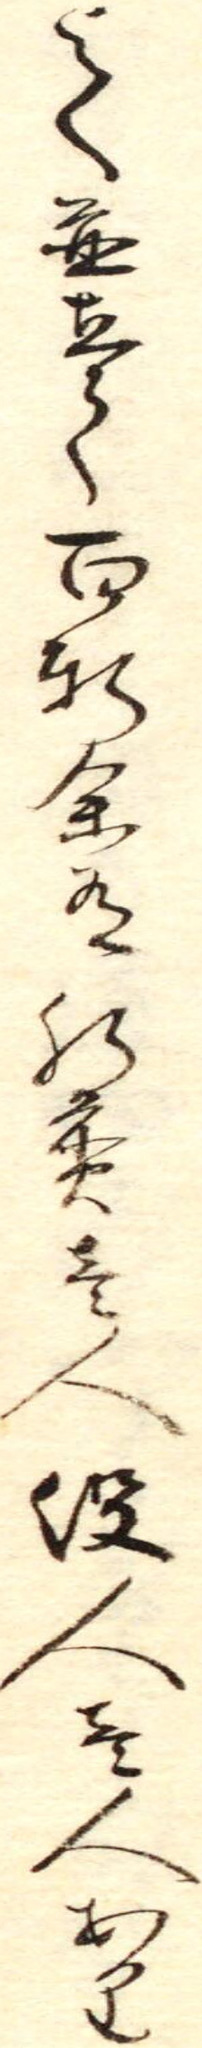よて並立て百軒余有肝煎壱人役人壱人あり
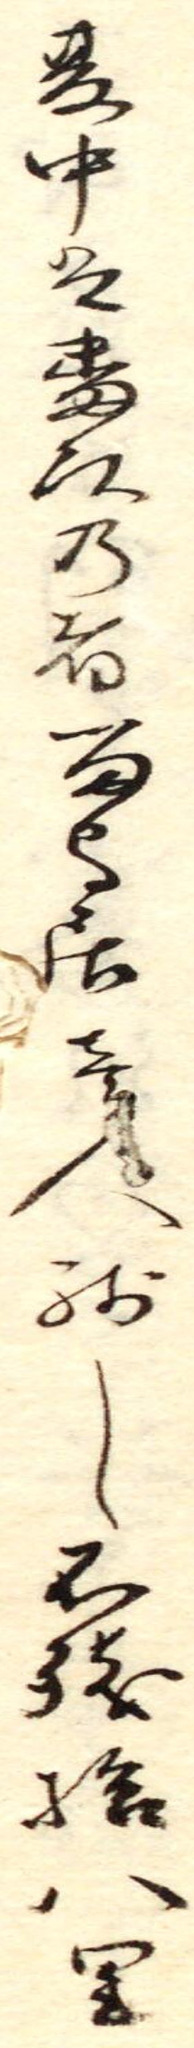夏中は番頭の者留守居壱人残し不残拾八里
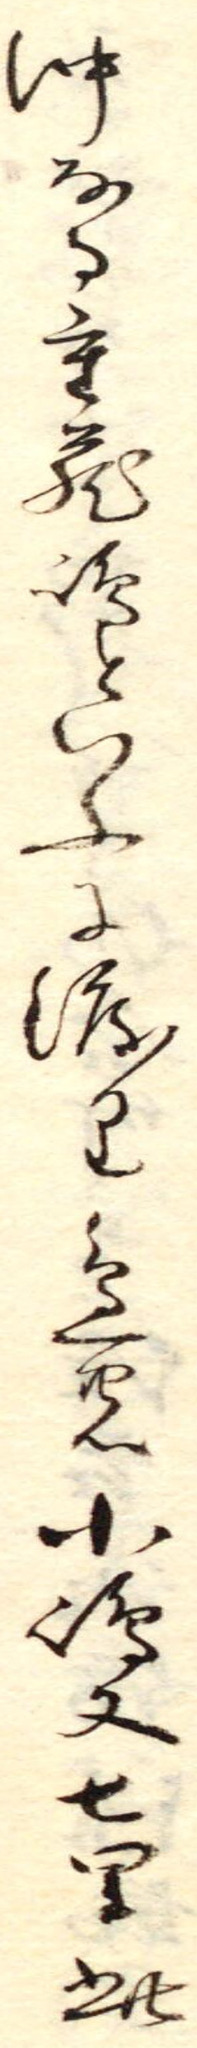沖なる重蔵嶋といふに渡り辺の小嶋又七里此
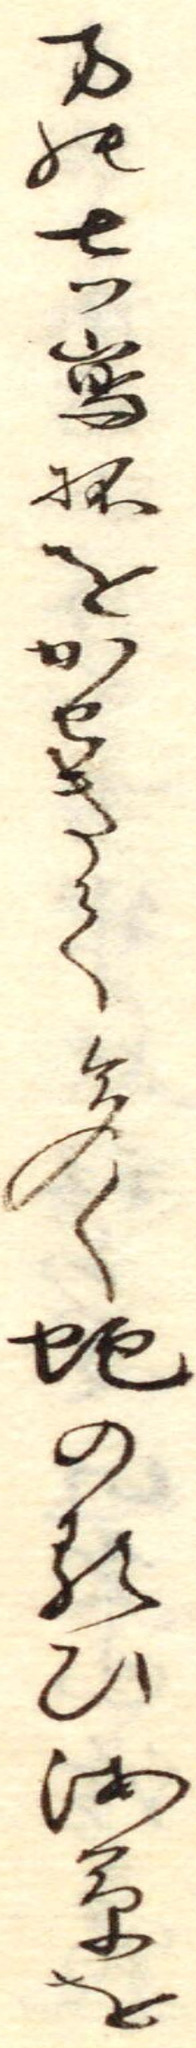方の七ッ嶌抔をかせきて多く蚫の類ひ海草を
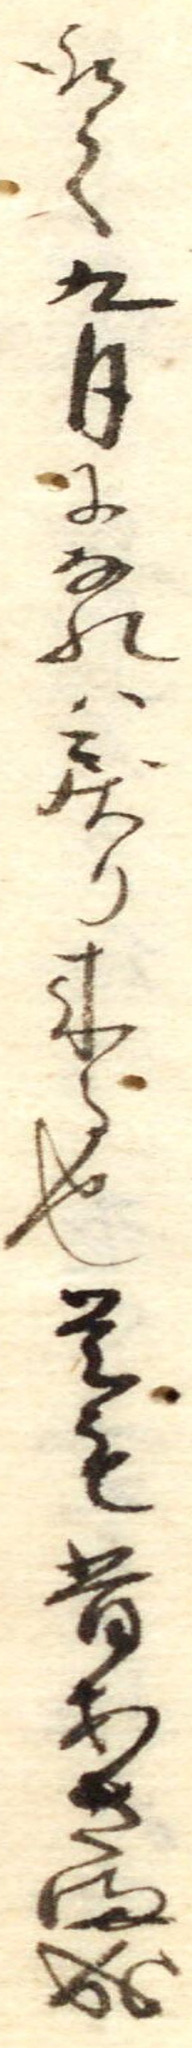取て九月になれは戻り来る也是も昔あさま成
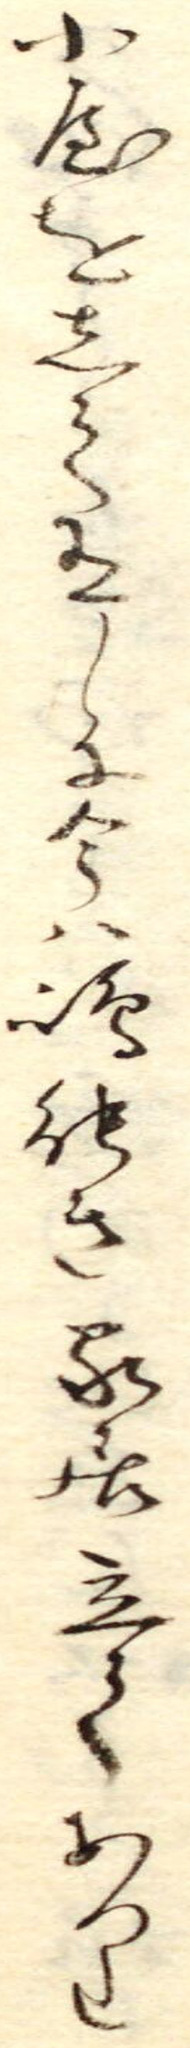小屋をして有しに今は嶋よき家居立てあり
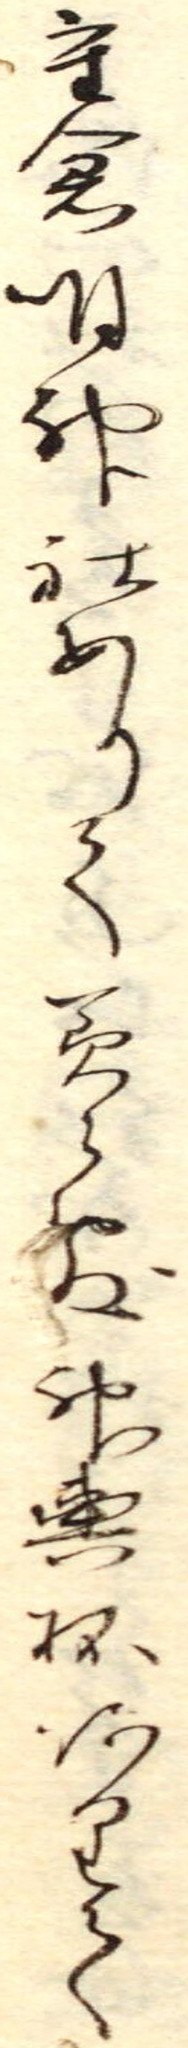重倉明神社ありて美々敷神輿抔ありて
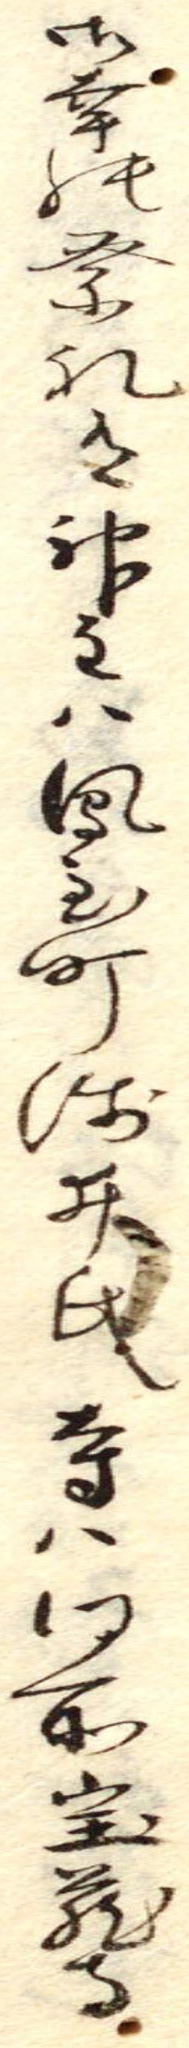御幸の祭礼有神主は鳳至町浅井氏寺は同所宝蔵寺
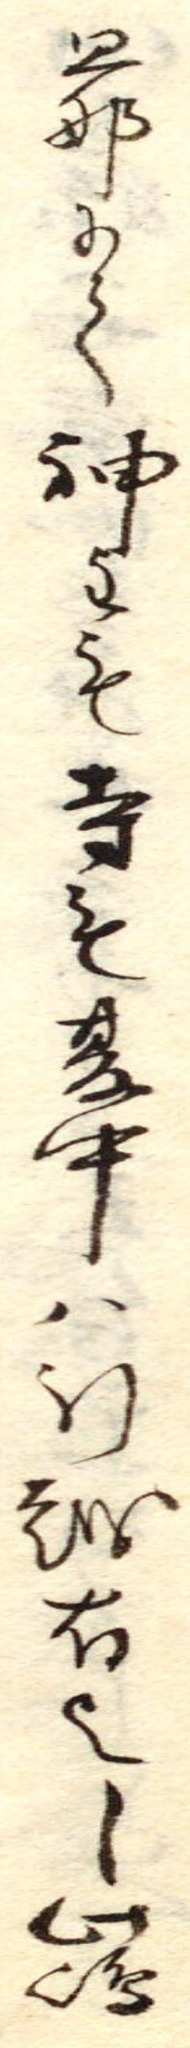旦那にて神主も寺も夏中は引越有よし此嶋
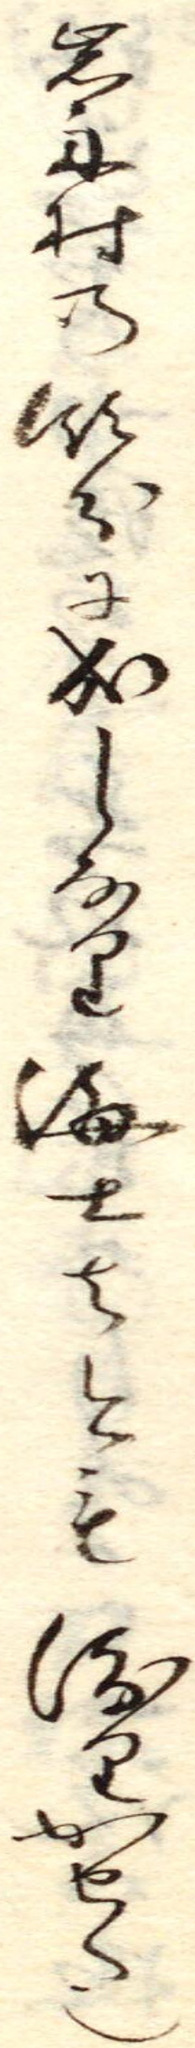岩舟村の領分に成しなり海士は今も渡りかせく也
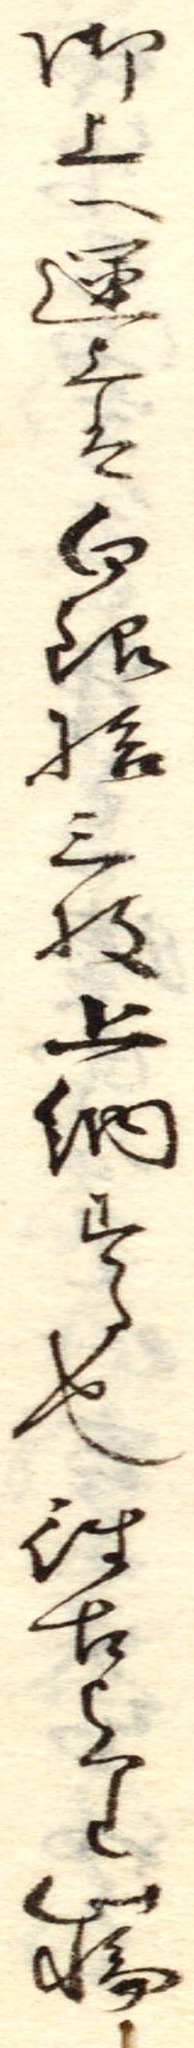御上へ運上は白銀拾三枚上納する也往古より此輪
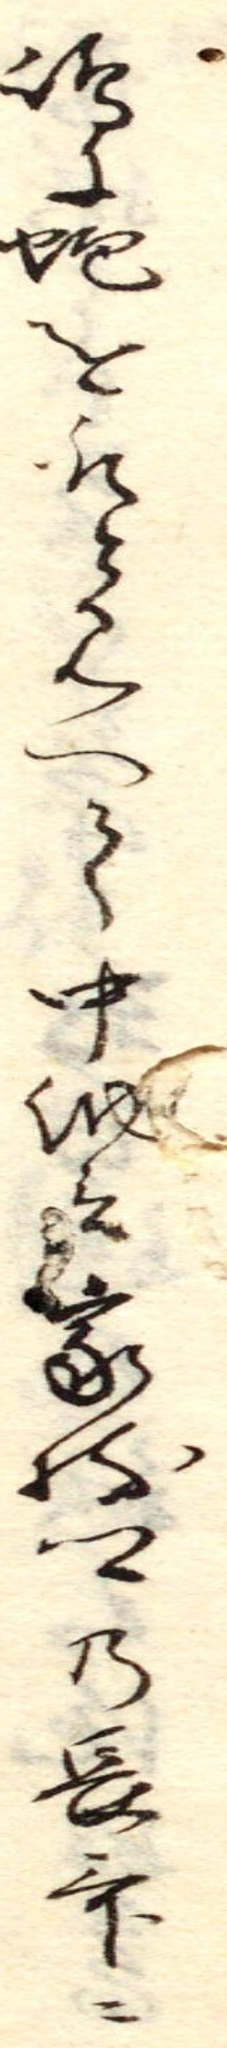嶋に蚫を取と見へて中納言家持卿の長哥に
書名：能登名跡誌
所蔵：Ishikawa Prefectural Library
